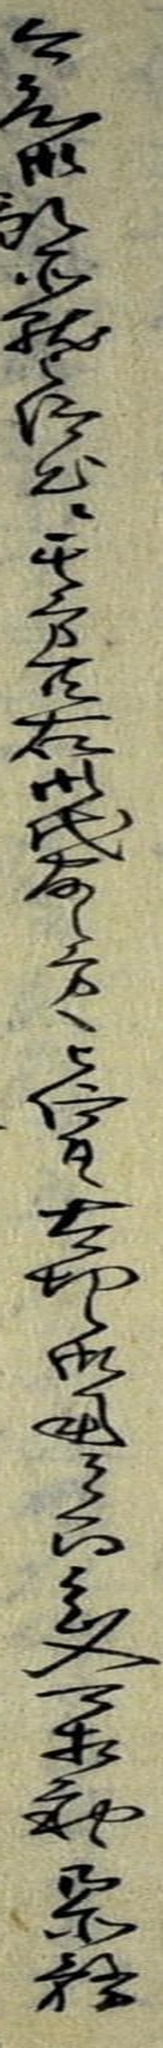今度御預所就被仰出ニ其方共右御代官之方へ被仰付候太切之御用ニ候間念入可相勤候御所務
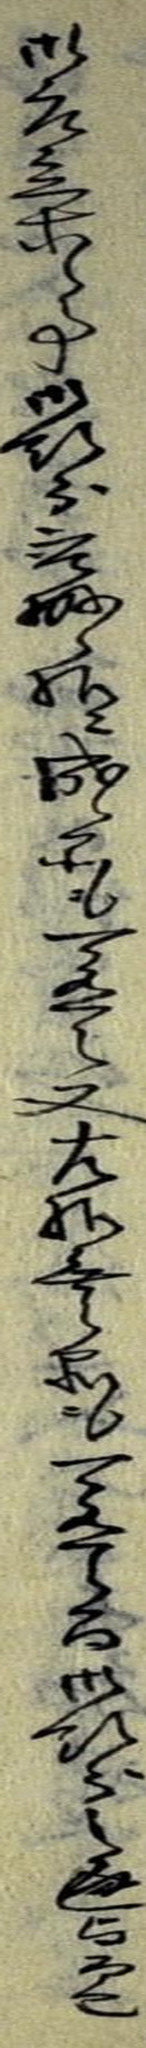御取立等之事御領分取扱候様ニ成候品も可有之又左様無之品も可有之候間御領分之通与而已
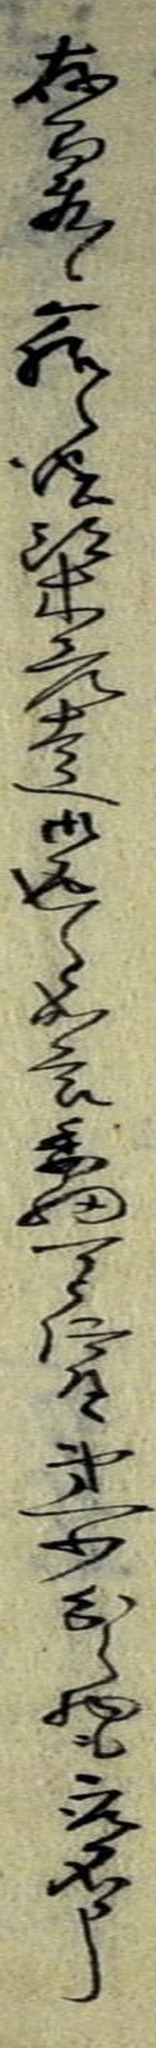存間敷候ケ様之儀ハ鈴木彦大夫御返し被成節委細可被仰付候第一少分之物も取不申
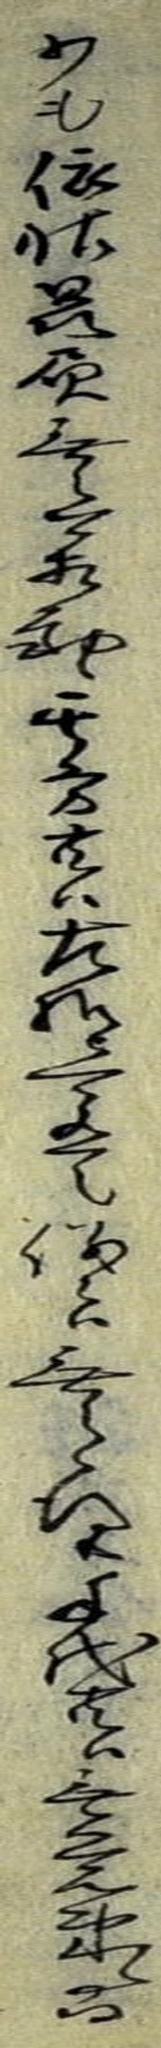少も依怙贔屓無之可相勤候其方共ハ左様ニ可有之儀ニハ無之候得共手代共ハ無覚束候間
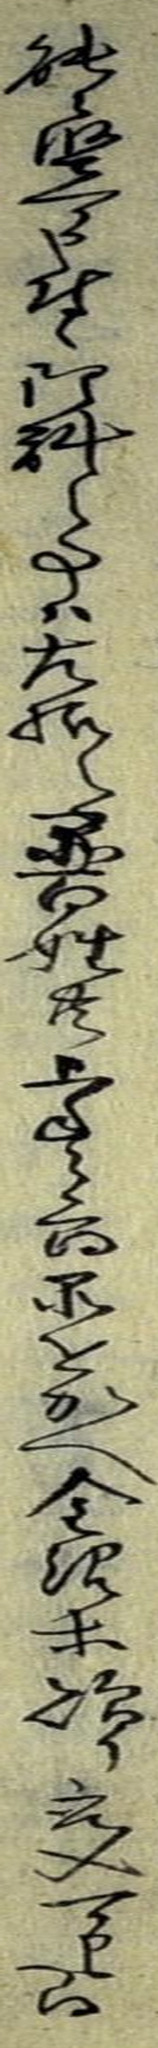能々堅可申付候御料之事ハ左様之品百姓共上手ニ候間品をかへ金銀等贈り取入可申候間
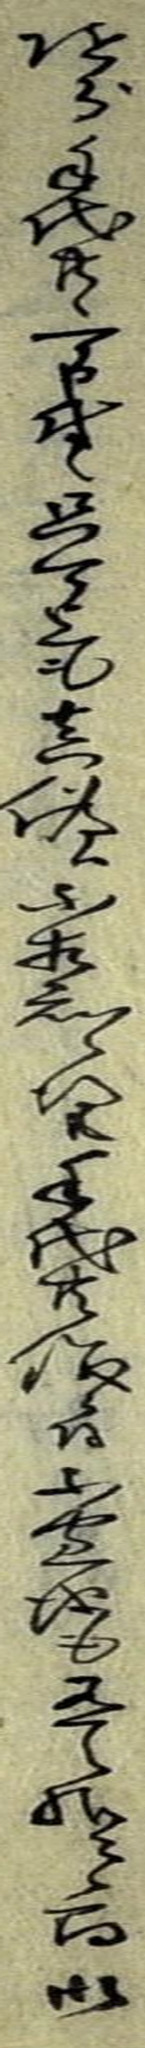随分手代共へ可申付候只今迄も真偽ハ不相知候得共手代共儀ニ付不宜儀も有之様ニ候間御
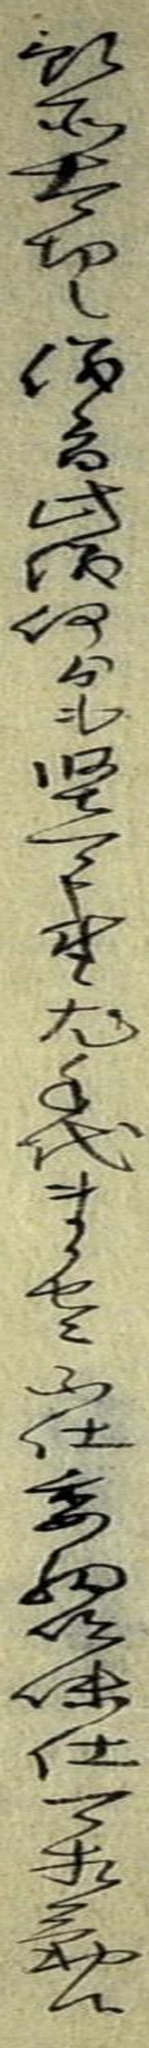預所太切之儀候間此儀何ゟも堅可申付候尤手代まかせニ不仕委細吟味仕可相勤候
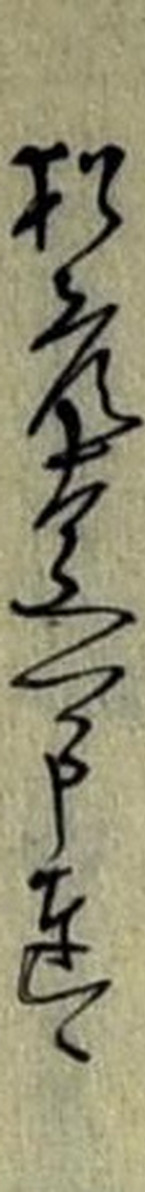猶彦大夫可申達候
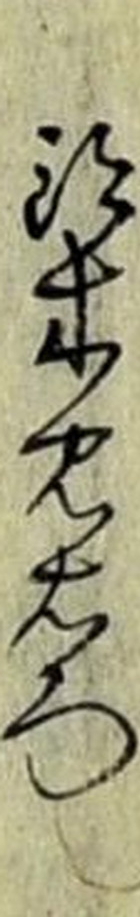鈴木忠右衛門
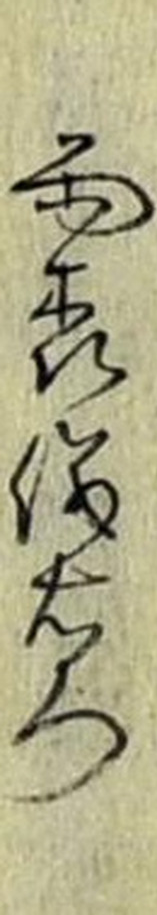雨森儀右衛門
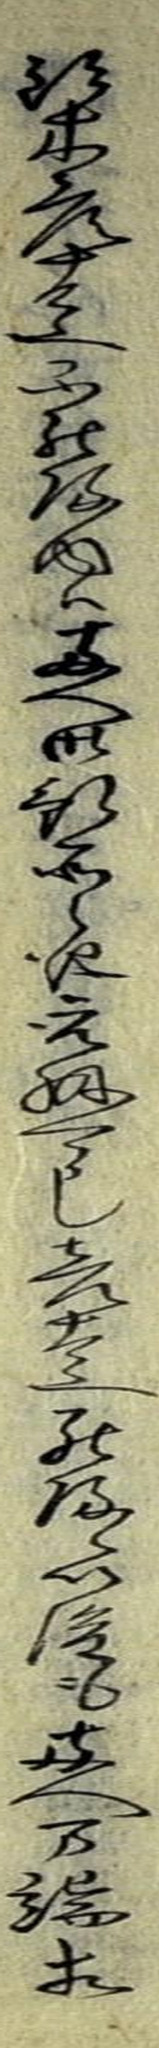鈴木彦大夫不罷帰内ハ両人御預所之儀取扱可申候彦大夫罷帰候以後も両人万端相
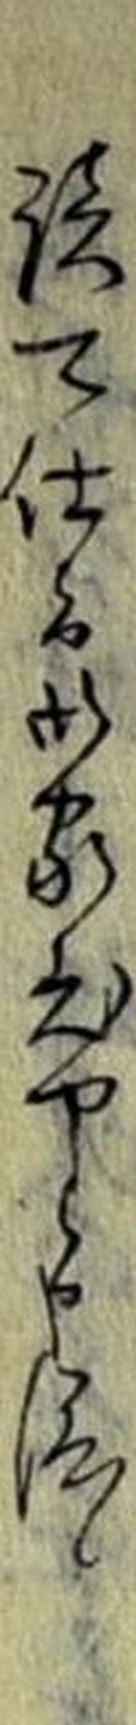談可仕旨御家老中被申渡候
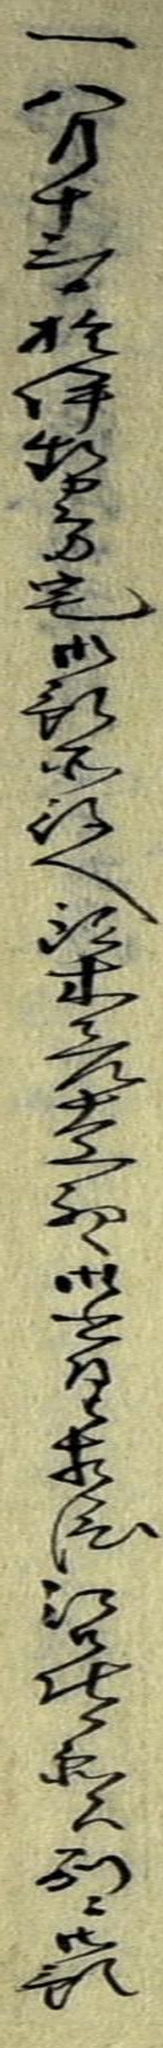一八月十三日於伊勢方宅御預所役人鈴木彦大夫初へ御書付被相渡江口次郎兵衛ヘハ別ニ御預

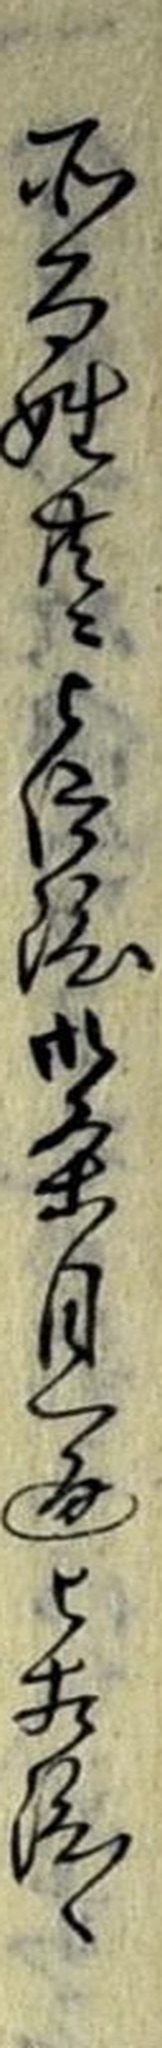所百姓共ニ被仰渡御条目一通被相渡候
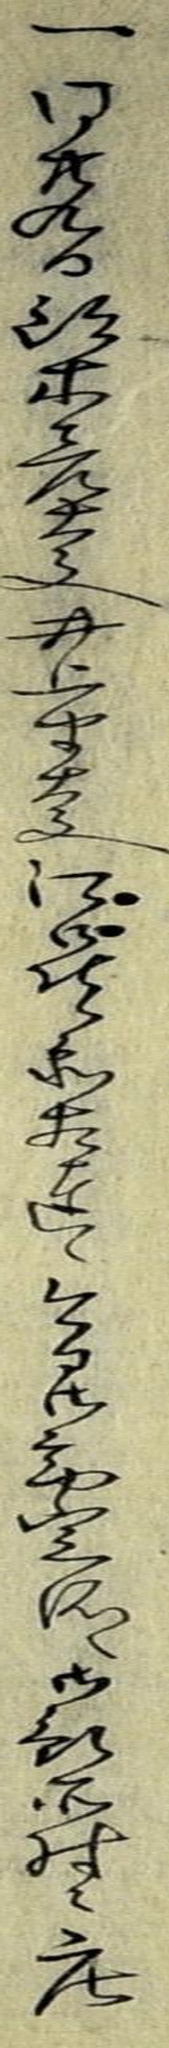一同廿九日鈴木彦大夫井上半大夫江口次郎兵衛相達候今日御勘定所へ御預所村々庄
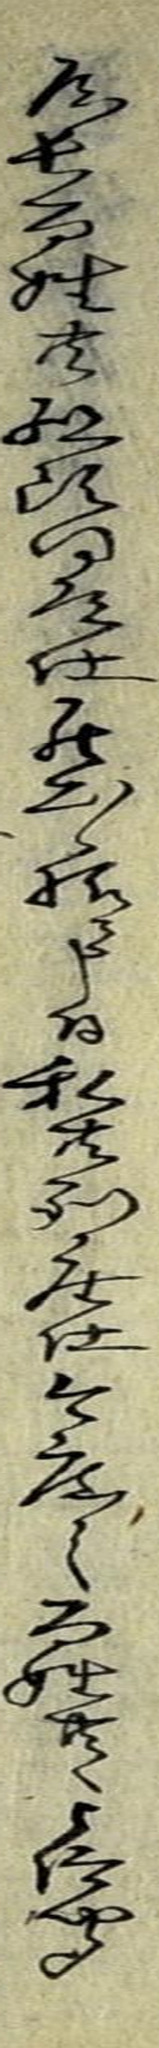屋長百姓共組頭同道仕罷出候様ニ申付私共列座仕今度之百姓共へ被仰聞
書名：命令之部 一
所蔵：福井県文書館 Fukui Prefectural Archives
